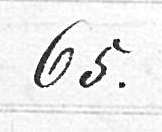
65.
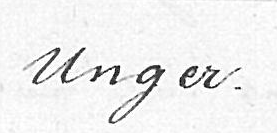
Unger.
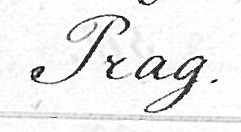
Prag
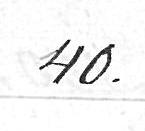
40.
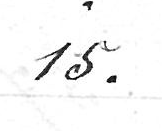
15.
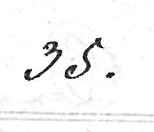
35.
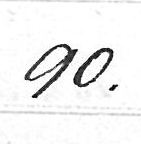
90.
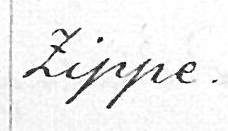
Zippe
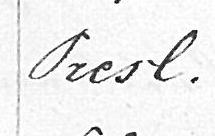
Presl
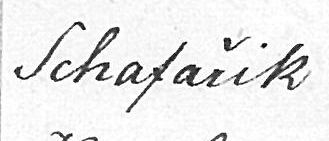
Schafarik
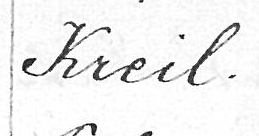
Kreil
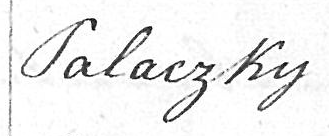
Palaczky
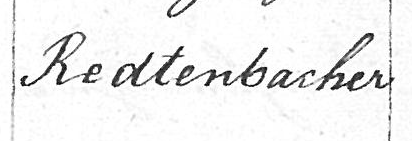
Redtenbacher
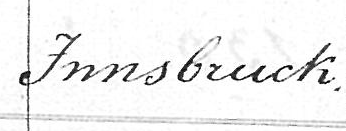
Innsbruck
